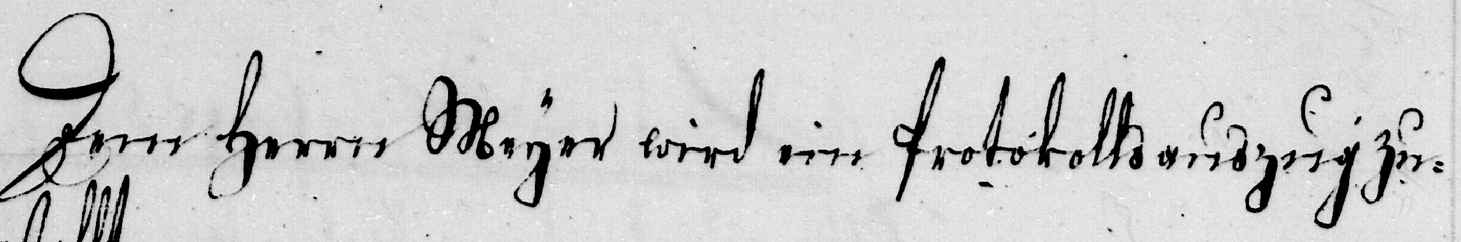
Dem Herrn Meyer wird ein Protokollsauszug zu¬
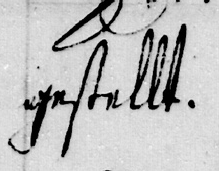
stell¬
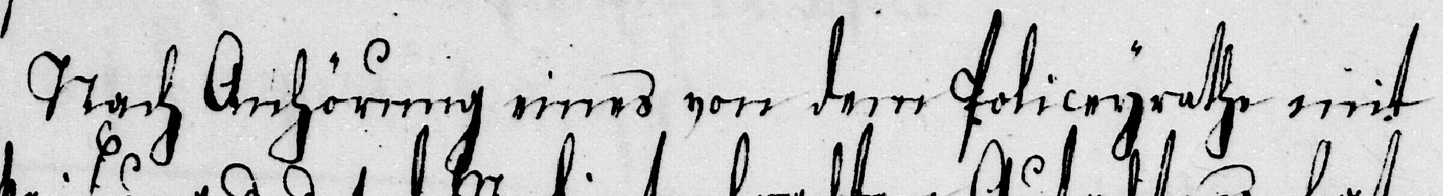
Nach Anhörung eines von dem Policeyrathe mit
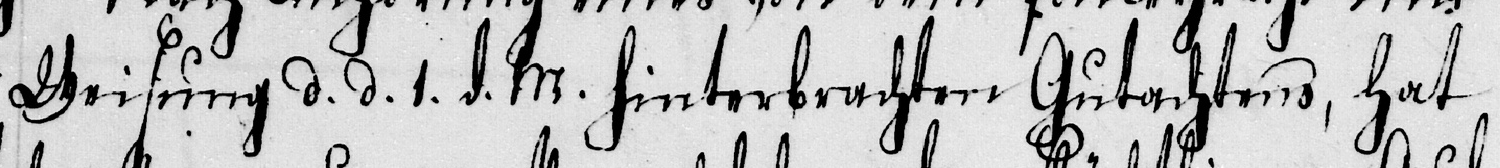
Weisung d. d. 1. d. M. hinterbrachten Gutachtens, hat
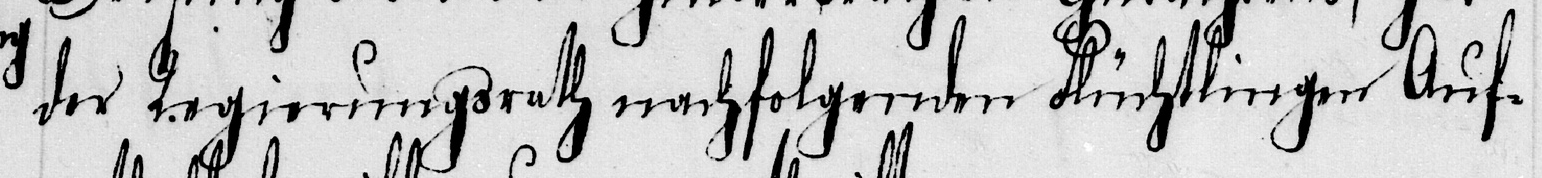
der Regierungsrath nachfolgenden Flüchtlingen Auf¬
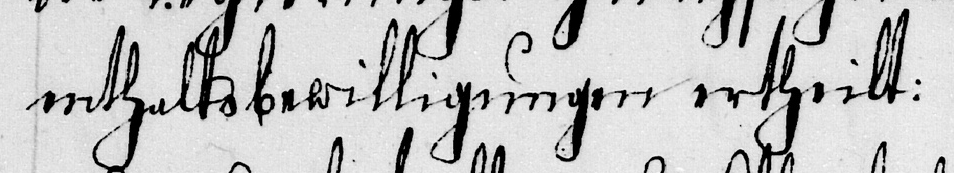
enthaltsbewilligungen ertheilt:
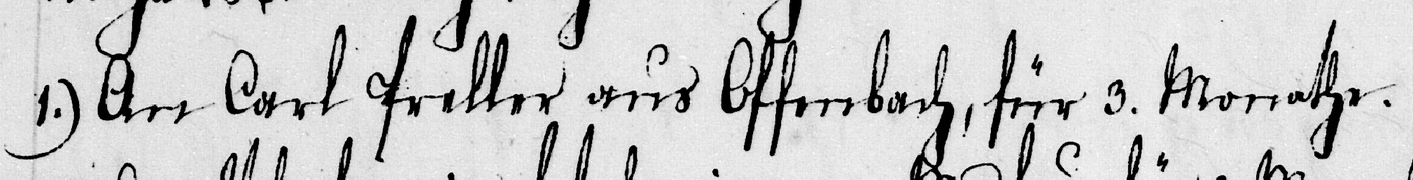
1.) An Carl Preller aus Offenbach, für 3. Monathe.
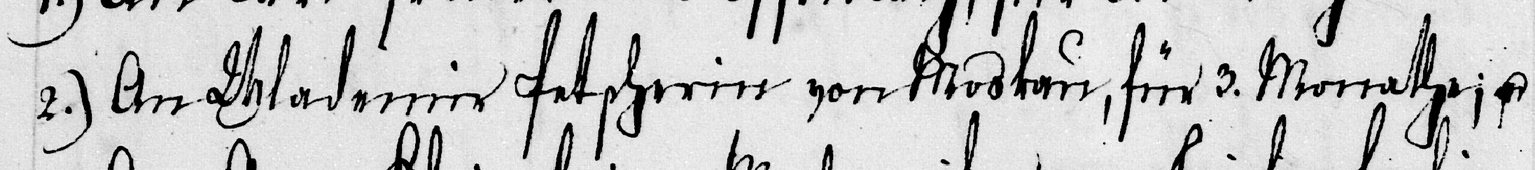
2.) An Wladimir Patscherin von Moskau, für 3. Monathe; &
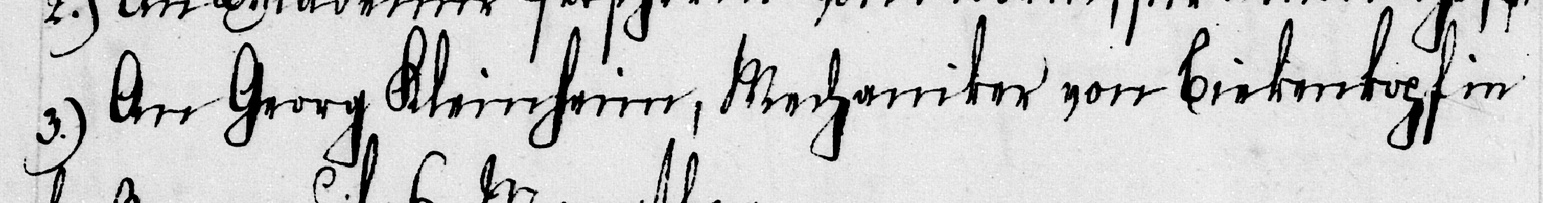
3.) An Georg Kleinheim, Mechaniker von Biekenkopf in
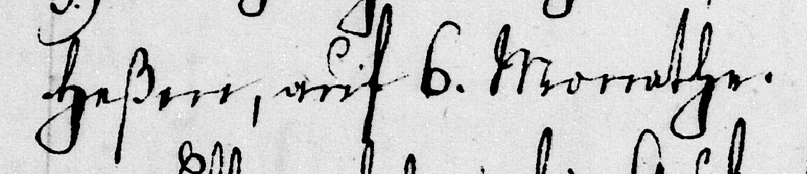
Heßen, auf 6. Monathe.
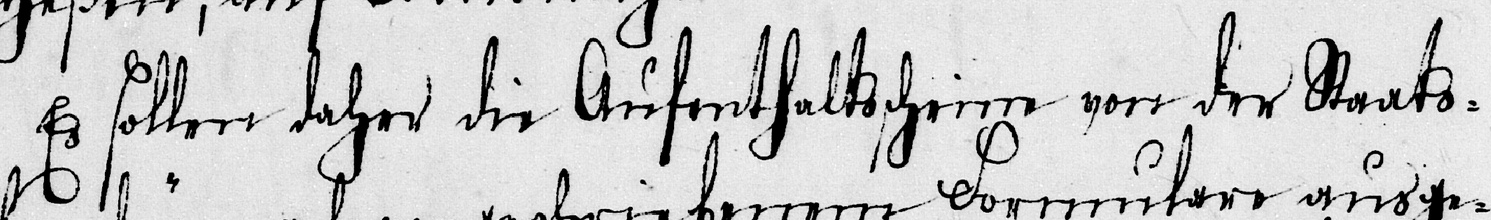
Es sollen daher die Aufenthaltsscheine von der Staats¬
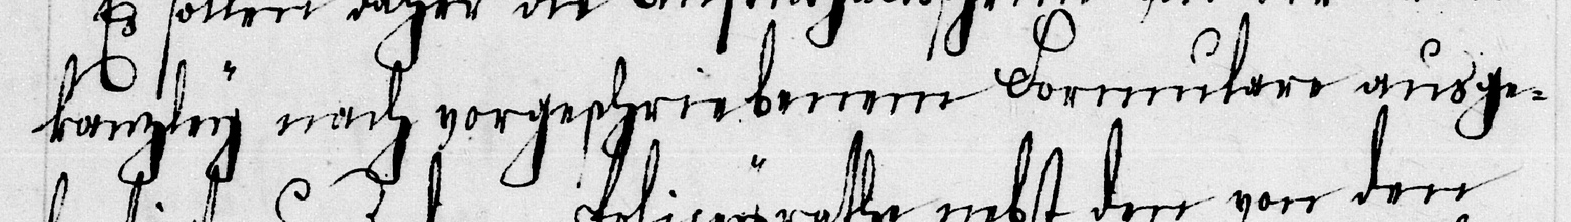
kanzley nach vorgeschriebenem Formulare ausge¬
